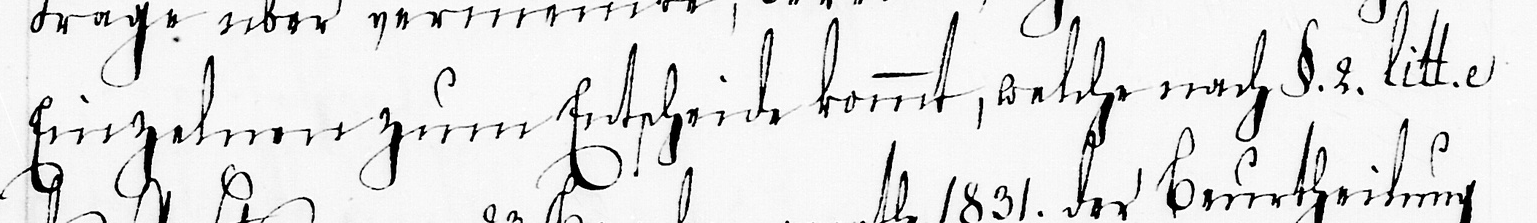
Einzelnen zum Entscheide kommt, welche nach §. 2.
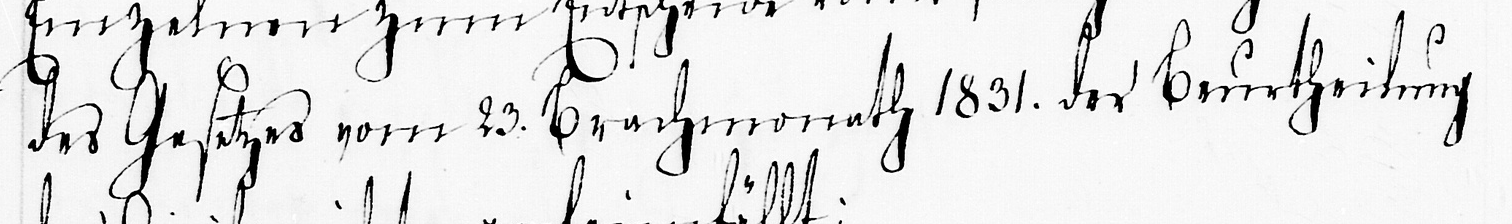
des Gesetzes vom 23. Brachmonath 1831. der Beurtheilung
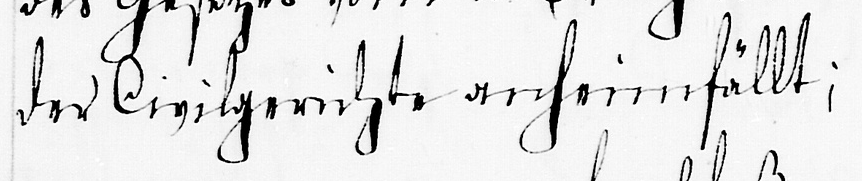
der Civilgerichte anheimfällt;
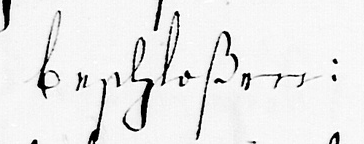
beschloßen:
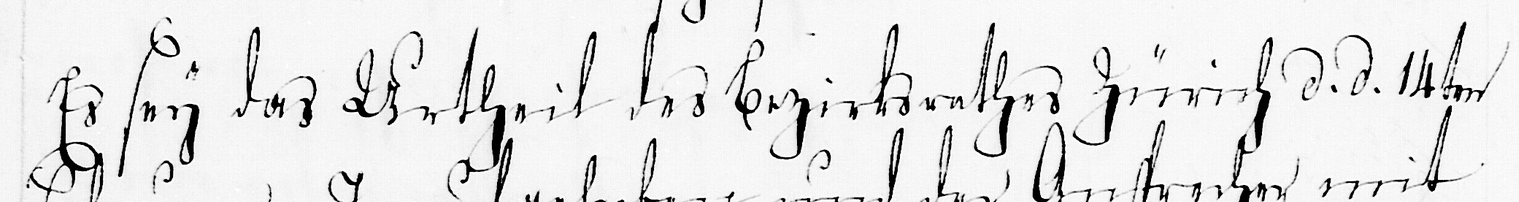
Es sey das Urtheil des Bezirksrathes Zürich d. d. 14ten
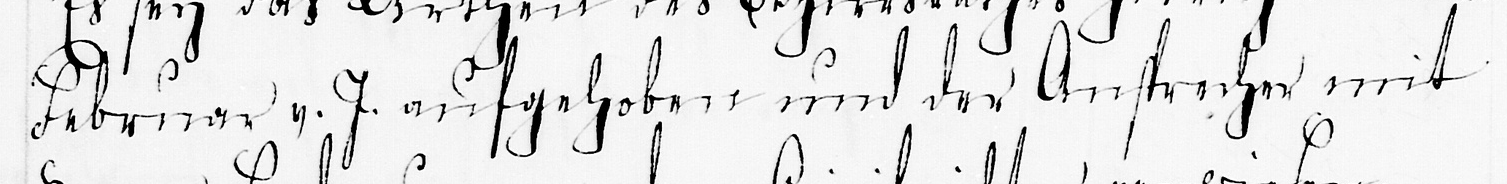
Februar v. J. aufgehoben und der Ansprecher mit
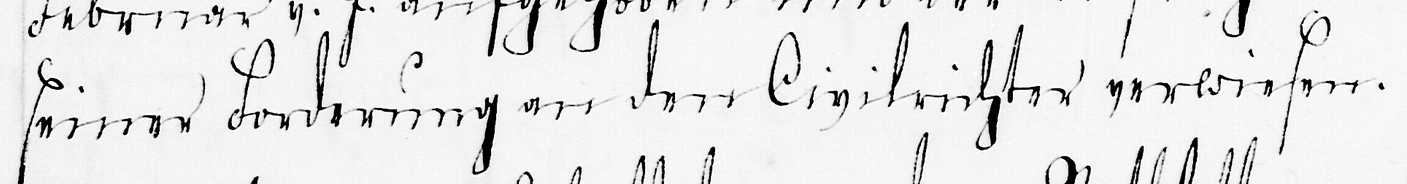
seiner Forderung an den Civilrichter verwiesen.
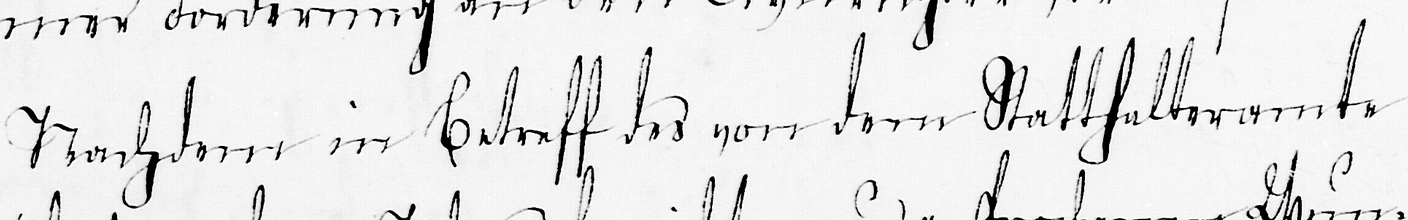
Nachdem in Betreff des von dem Statthalteramte
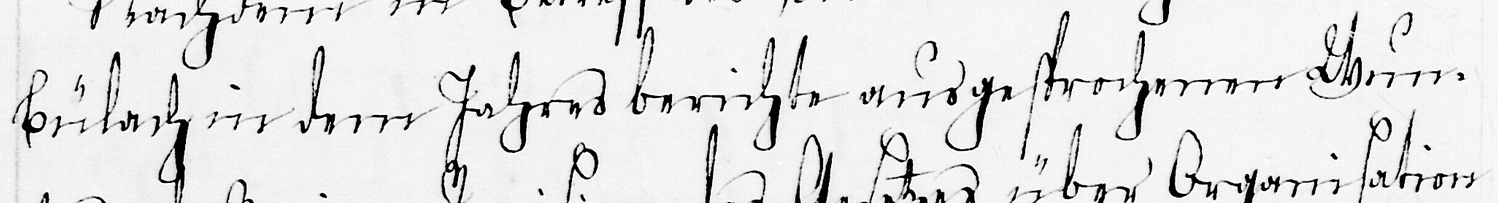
Bülach in dem Jahresberichte ausgesprochenen Wuns¬
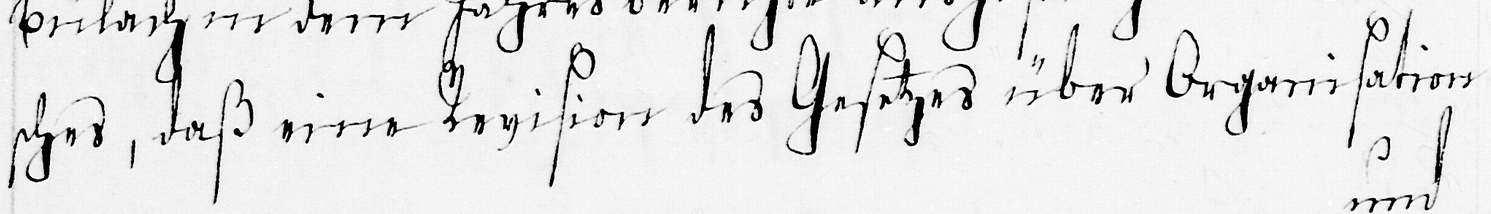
ches, daß eine Revision des Gesetzes über Organisation
